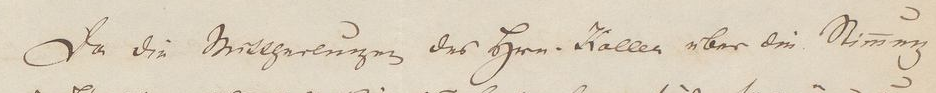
Da die Mittheilungen des Hrn. Koller über die Stimmung
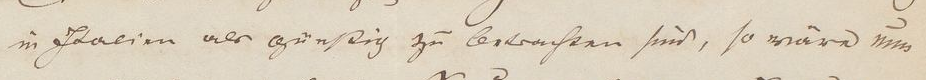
in Italien als günstig zu betrachten sind, so wäre nun
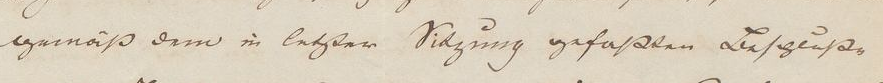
gemäß dem in letzter Sitzung gefaßten Beschluße
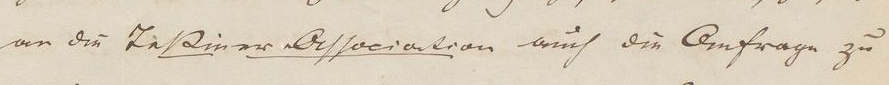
an die Teßiner Association auch die Anfrage zu
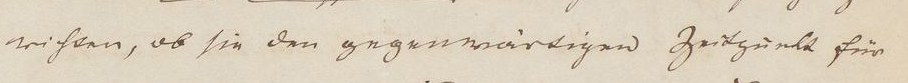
richten, ob sie den gegenwärtigen Zeitpunkt für
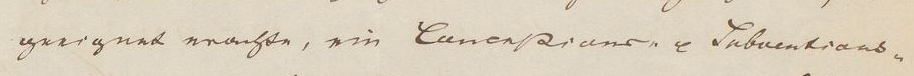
geeignet erachte, ein Conceßions- & Subventions-
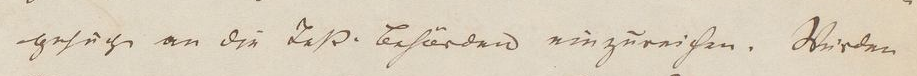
gesuche an die Teß. Behörden einzureichen. Würden
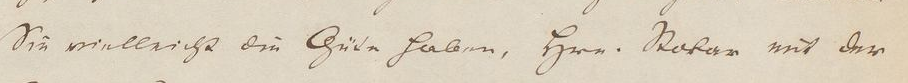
Sie vielleicht die Güte haben, Hrn. Stokar mit der
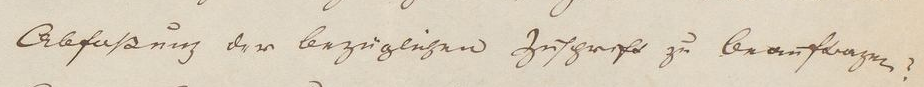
Abfaßung der bezüglichen Zuschrift zu beauftragen?
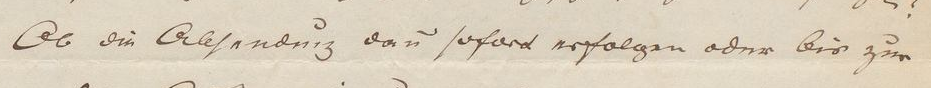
Ob die Absendung dann sofort erfolgen oder bis zur
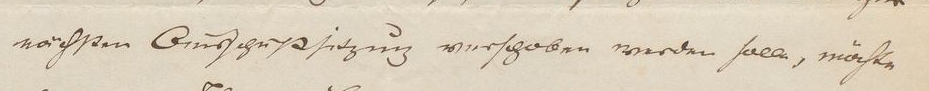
nächsten Ausschußsitzung verschoben werden solle, möchte
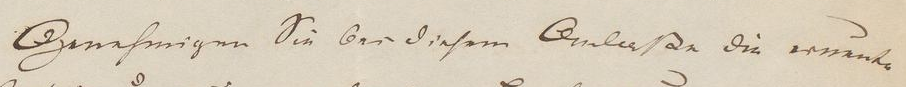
Genehmigen Sie bei diesem Anlaße die erneute
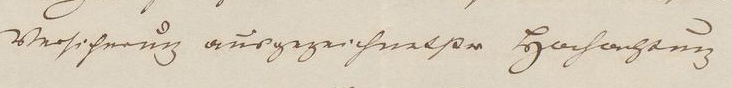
Versicherung ausgezeichnetster Hochachtung
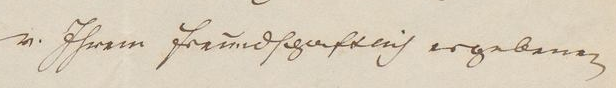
v. Ihrem freundschaftlich ergebenen
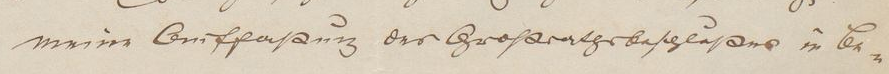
meine Auffaßung des Großrathsbeschlußes in Be-
